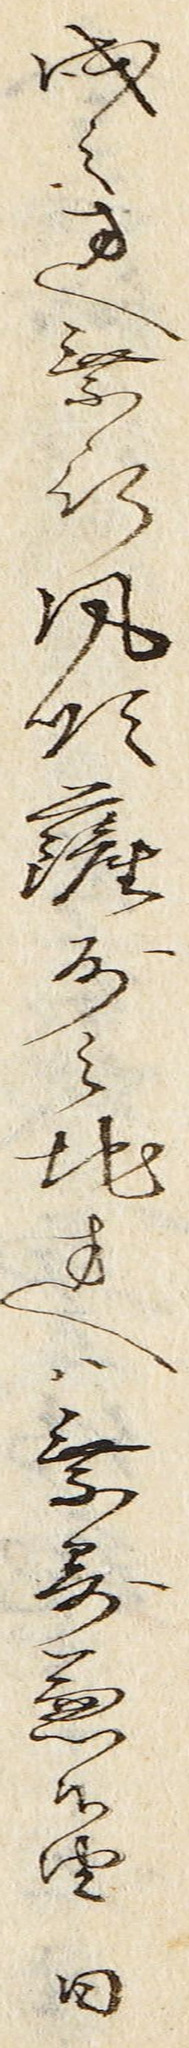戌之方へ乗行風順薩州之地方へは乗寄兼候故日
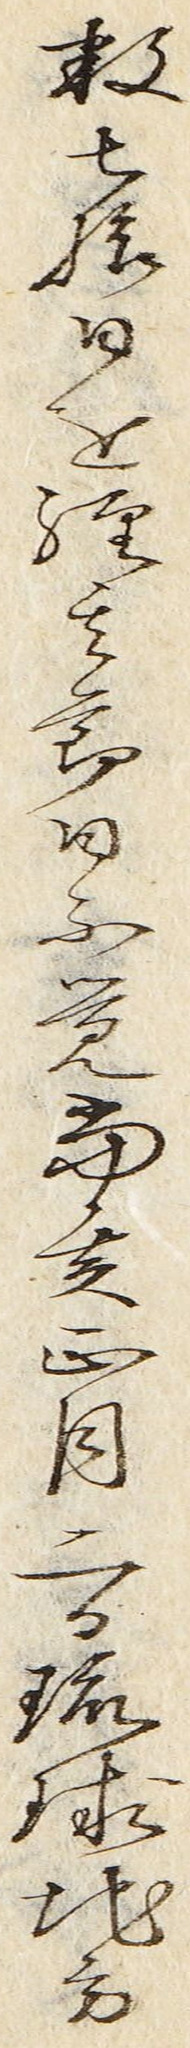数七拾日を経其節日不覚当亥正月二日琉球地方
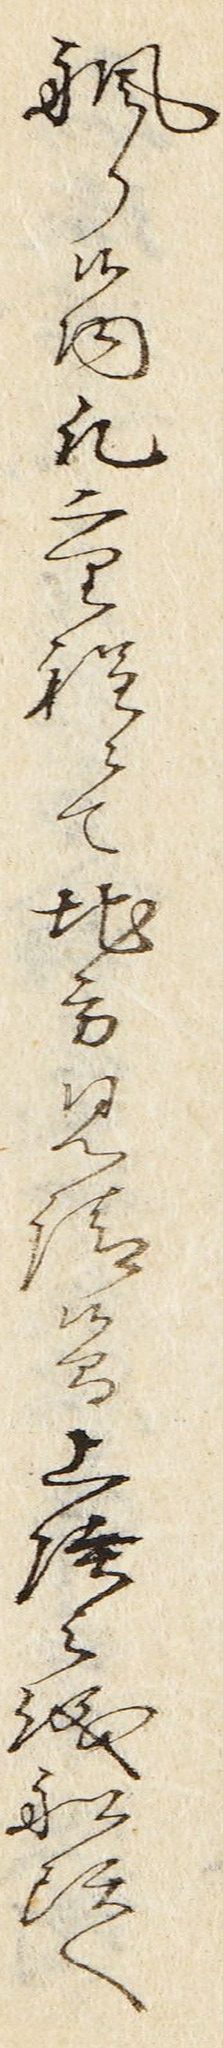䑺り候内凡二里程にて地方見請候間上陸之儀船頭へ
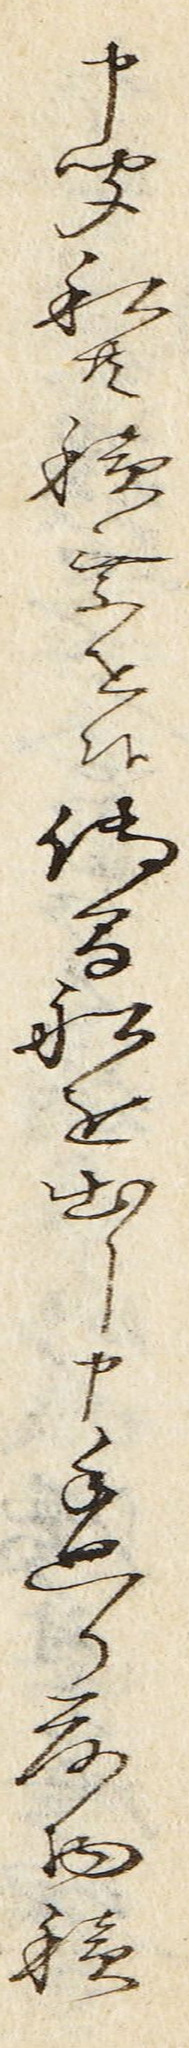申聞私共積乗せ候伝間船を出し申手廻り荷物積
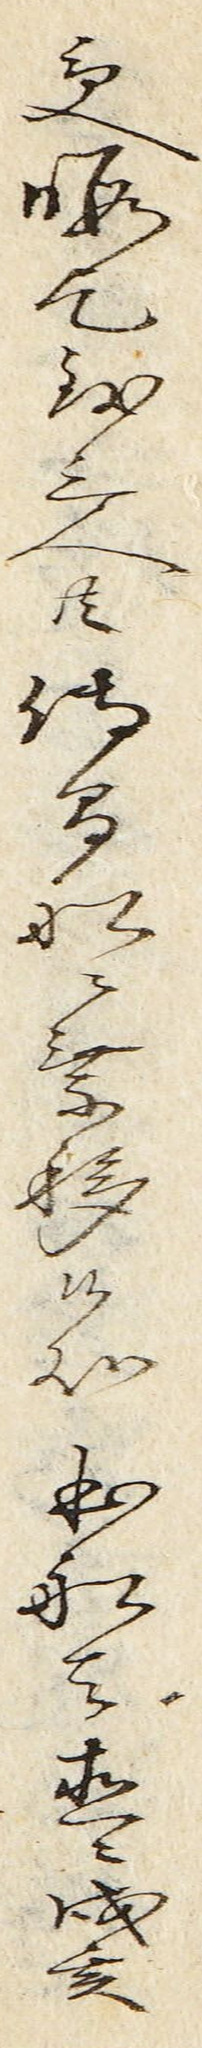受暇乞致三人共伝間船に乗移候処本船は直に戌亥
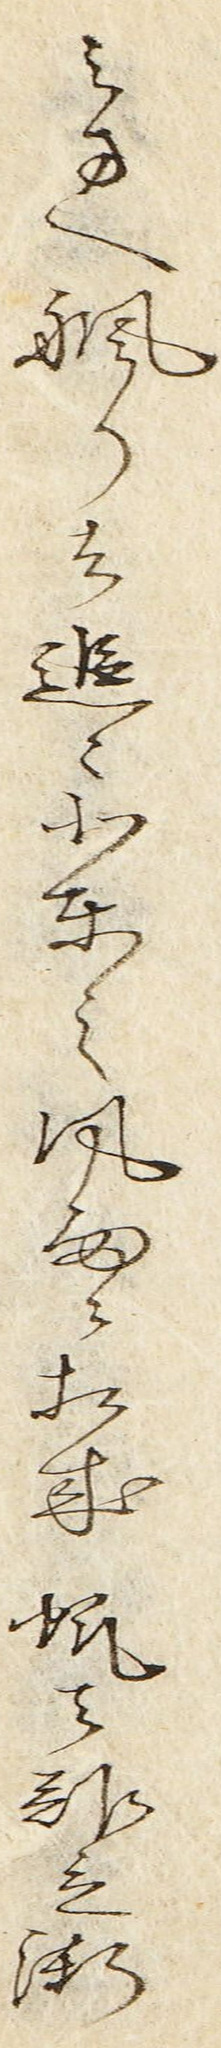之方へ䑺りは追々北東の風雨に相成帆は難立漸

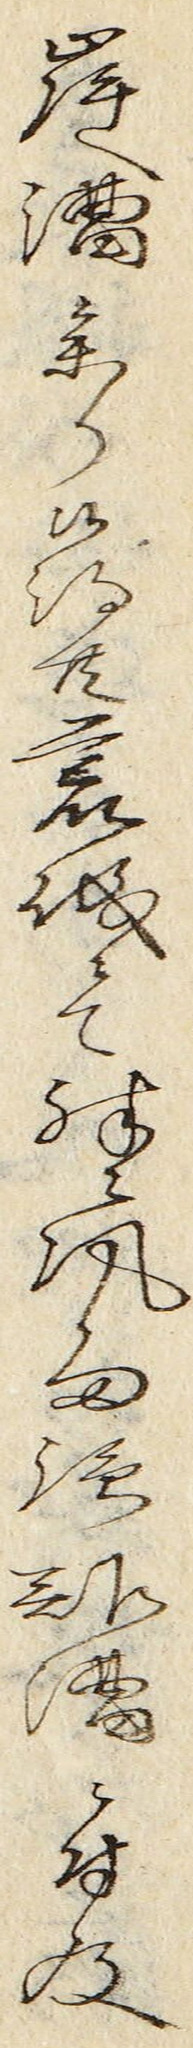岸へ漕参り候得共荒儀にて殊に風雨強難漕に付及
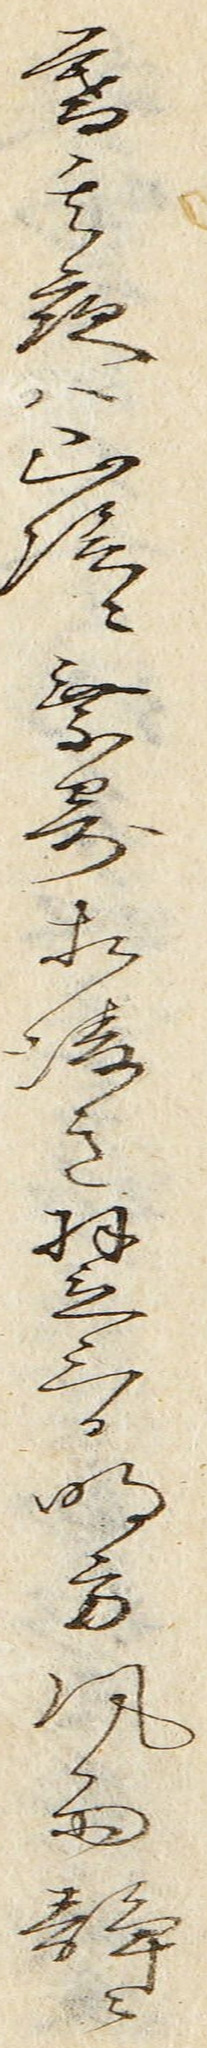暮其夜は山陰に乗寄相凌き翌三日明方風雨静に
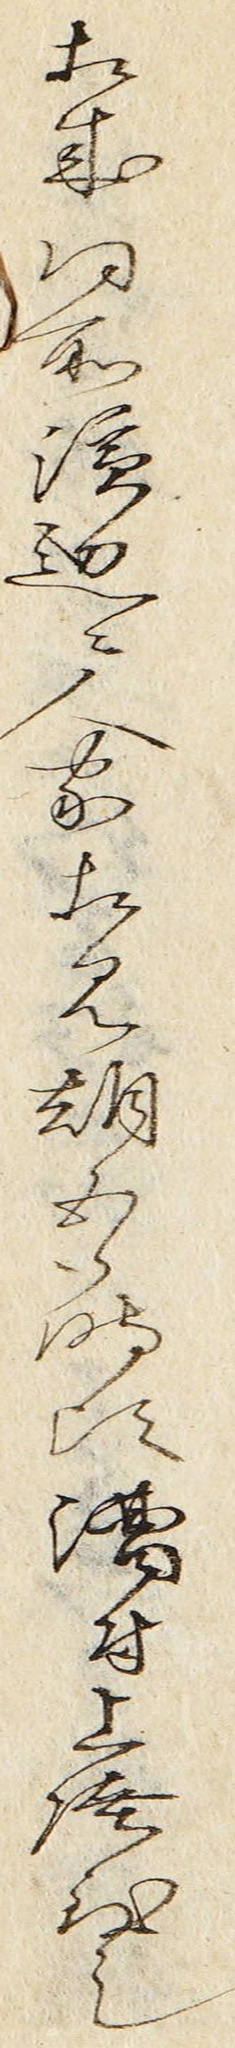相成同所浜辺に人家相見朝五ッ時頃漕付上陸致し
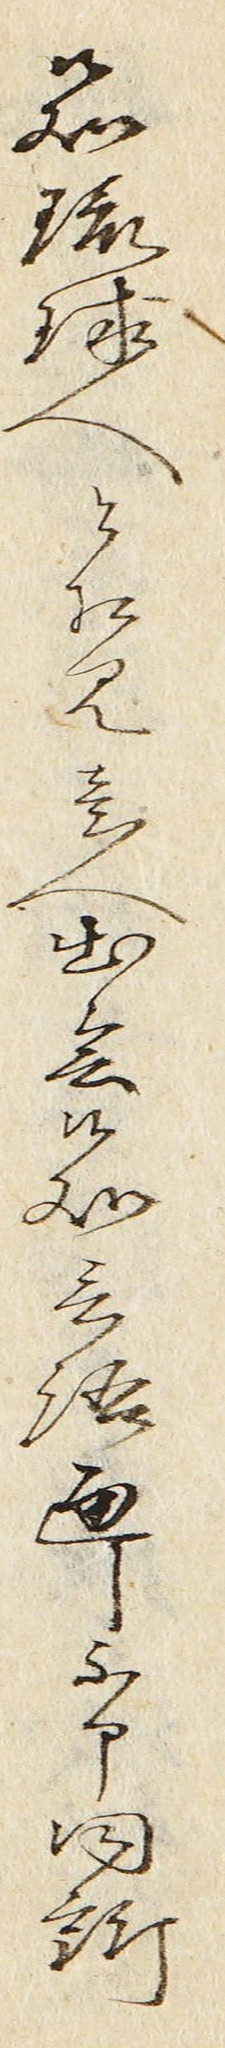候処琉球人と相見壱人出会候処言語通し不申同所
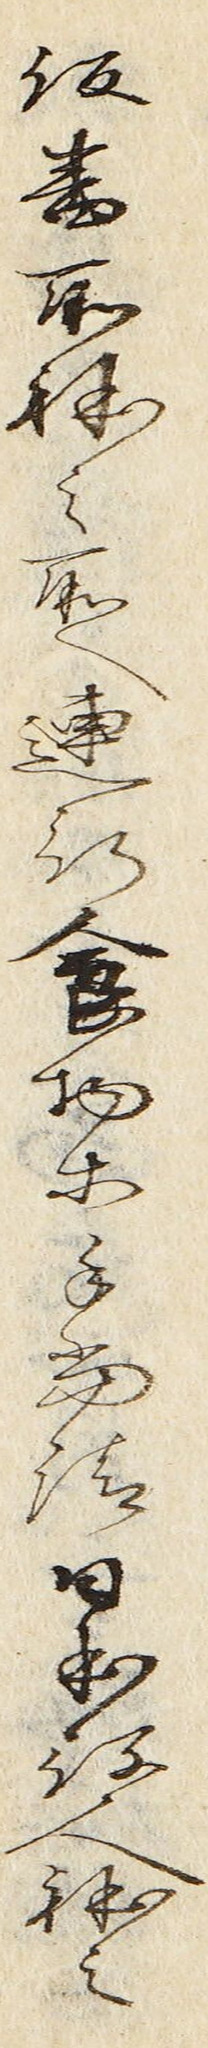仮番所躰之所へ連行食物等手当請日本役人躰之
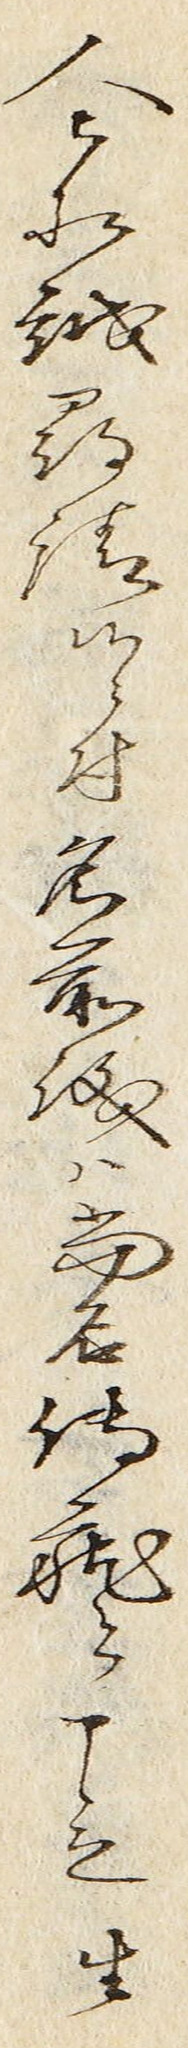人被相越尋請候に付名前儀は当名伝蔵と申立正生
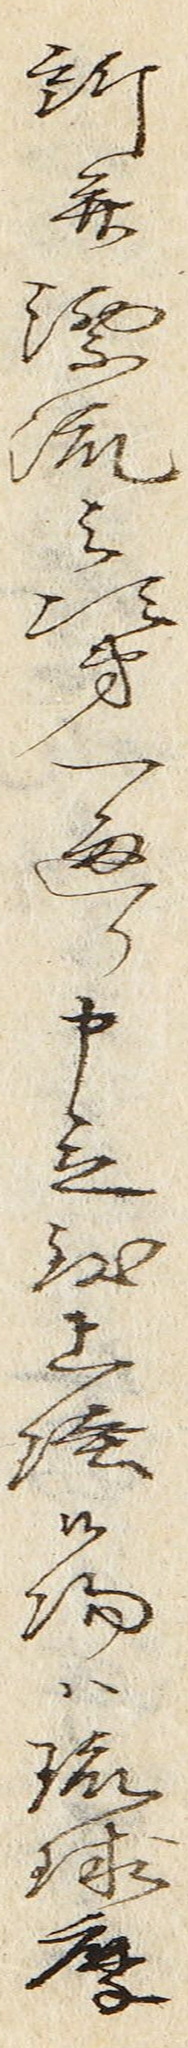所并漂流之次第一通り申立致上陸候場は琉球摩
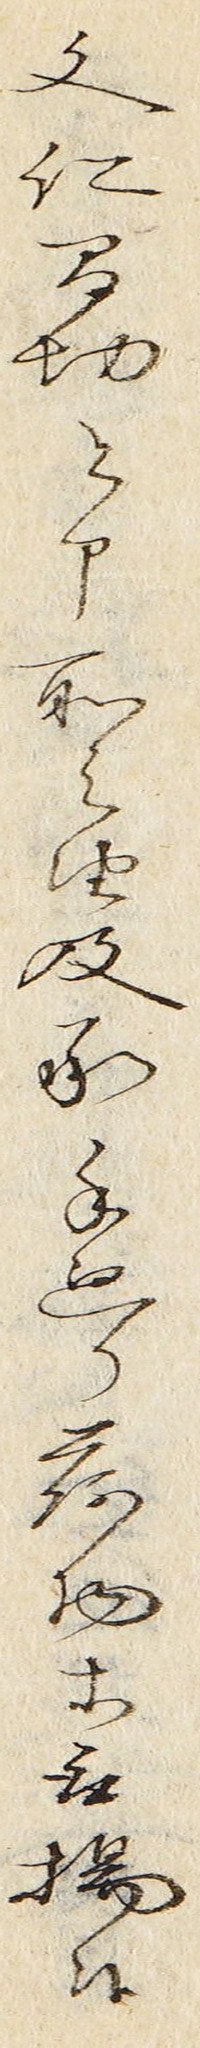文仁間切と申所之由及承手廻り荷物相取揚候
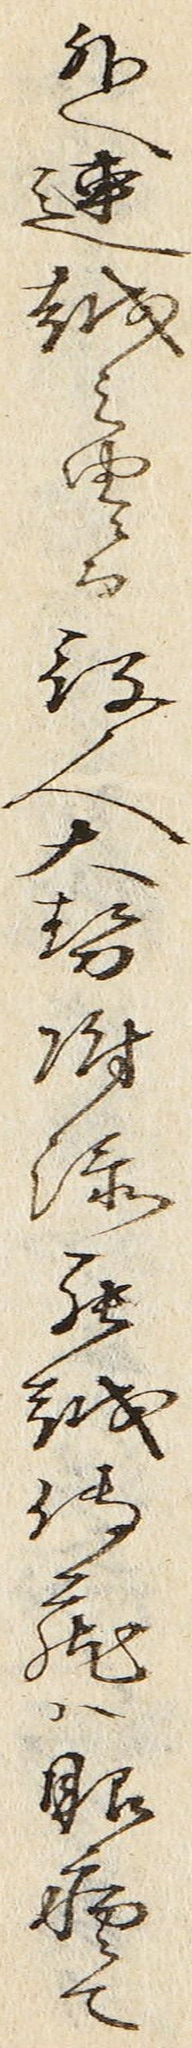外へ連越之由に而役人大勢附添罷越伝蔵は眼病にて
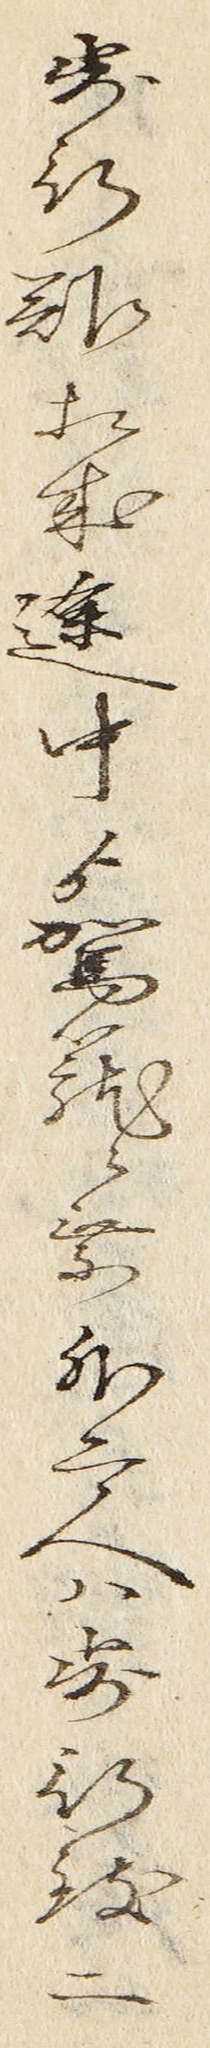歩行難相成途中ゟ駕籠に乗外二人は歩行致二
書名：土佐中浜万次郎漂流記
